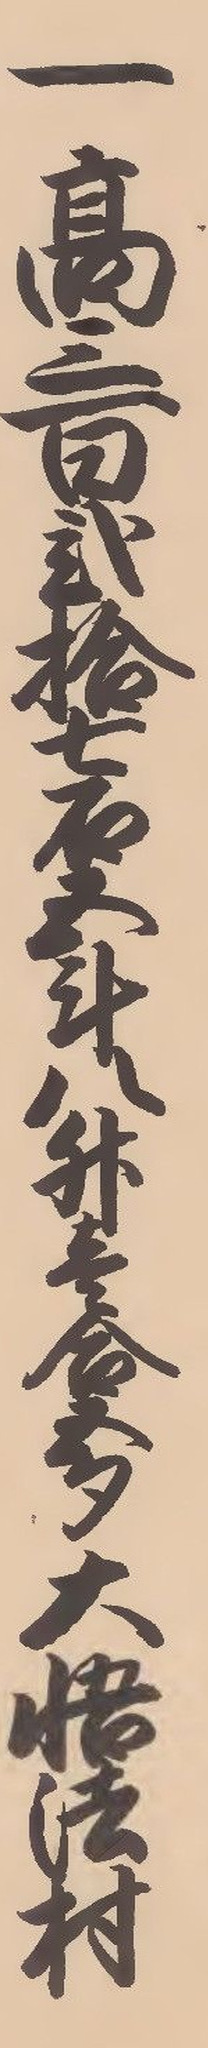一髙三百弐拾七石五斗八升壱合五夕大悟法村
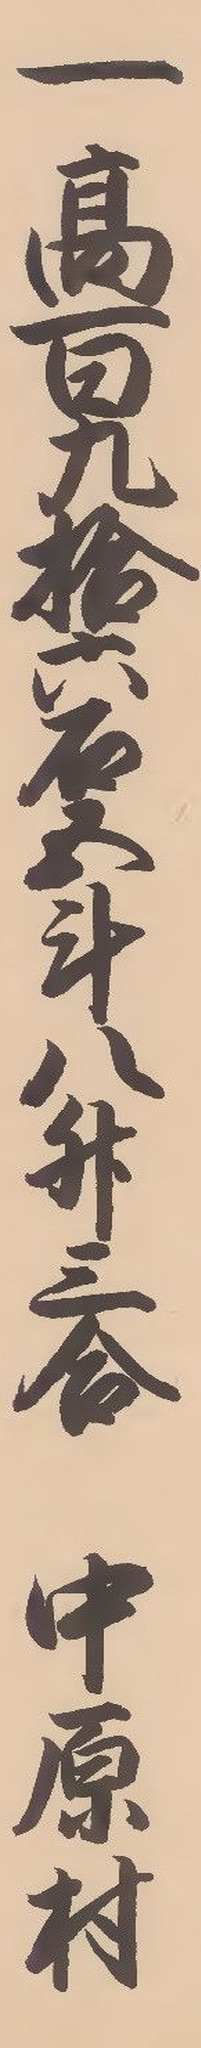一髙百九拾六石五斗八升三合中原村
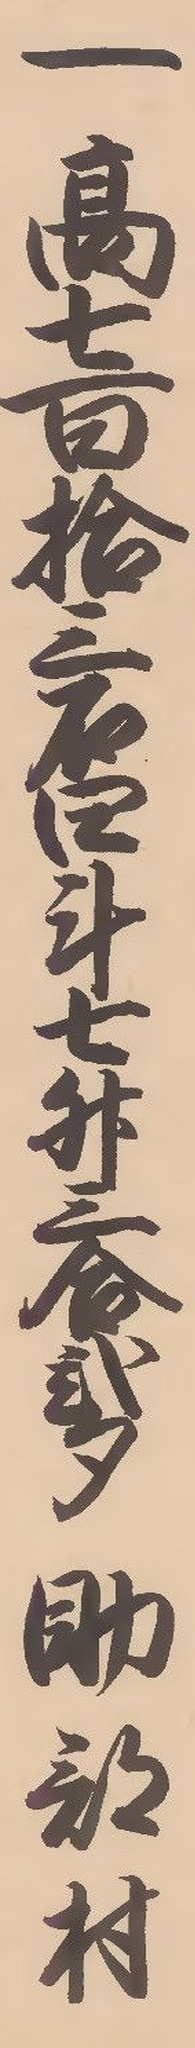一高七百拾三石四斗七升三合弐夕助部村

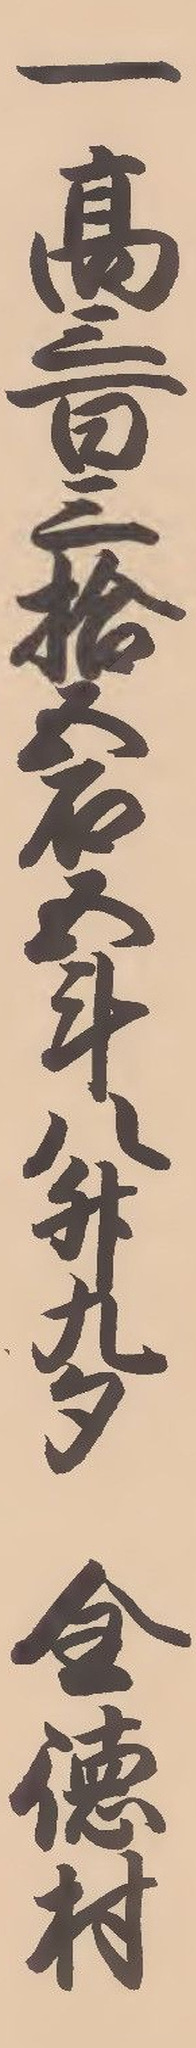一髙三百三拾五石五斗八升九夕全徳村
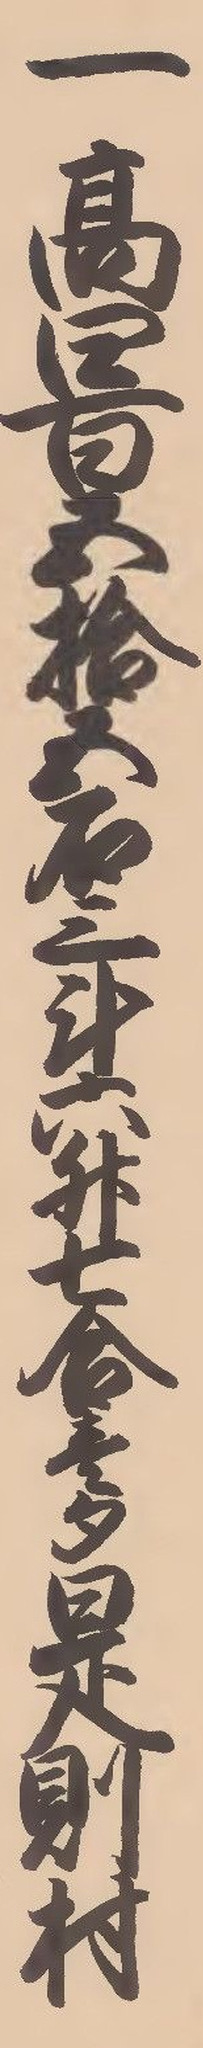一高四百五拾五石三斗六升七合壱夕是則村
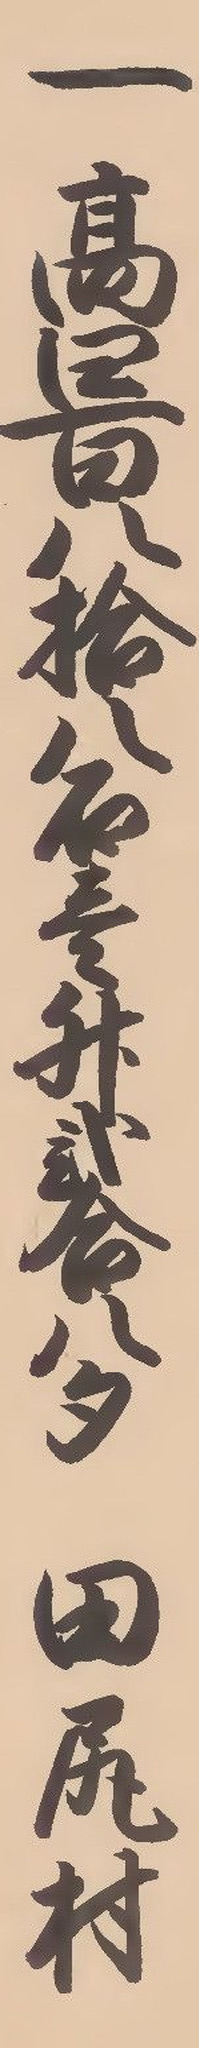一髙四百八拾八石壱升弐合八夕田尻村
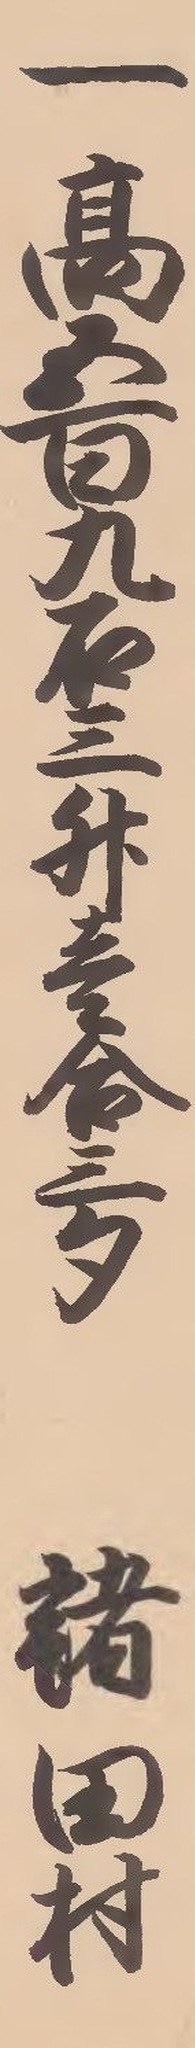一髙五百九石三升壱合三夕諸田村
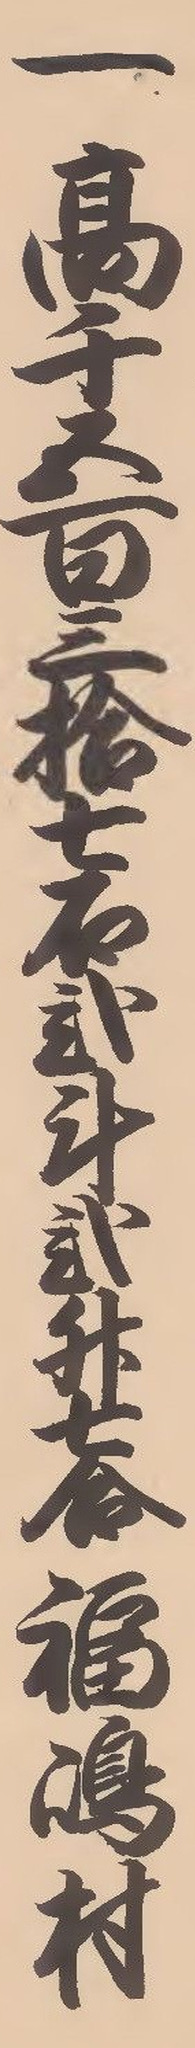一髙千五百三拾七石弐斗弐升七合福嶋村
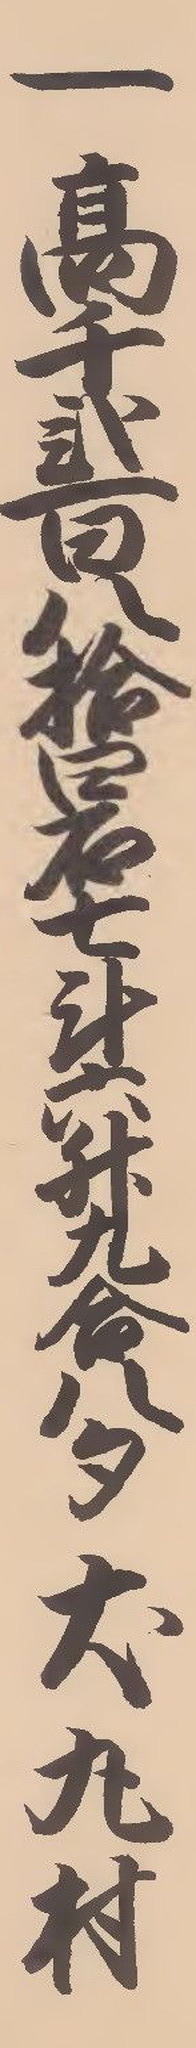一髙千弐百八拾四石七斗六升九合八夕犬丸村
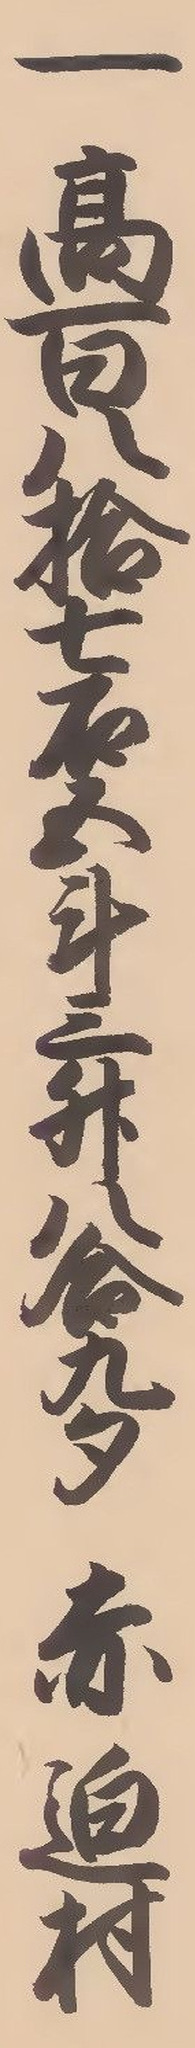一髙百八拾七石五斗三升八合九夕赤迫村

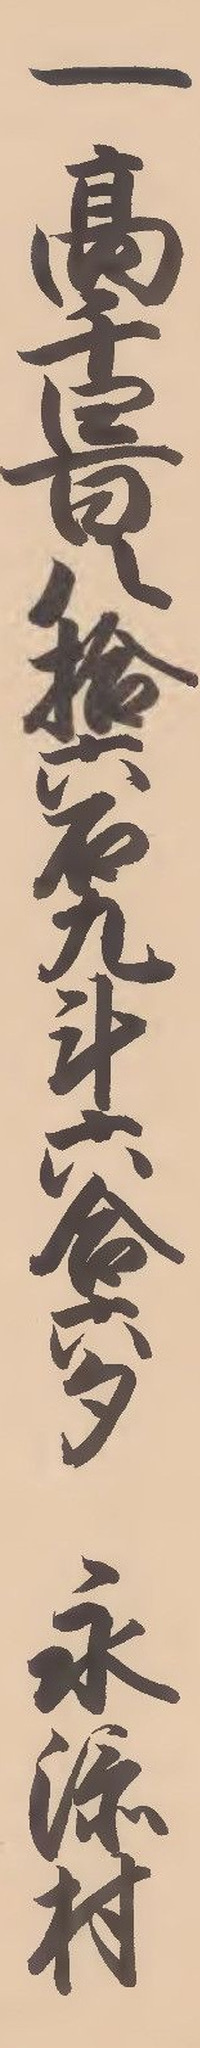一高千四百八拾六石九斗六合六夕永添村
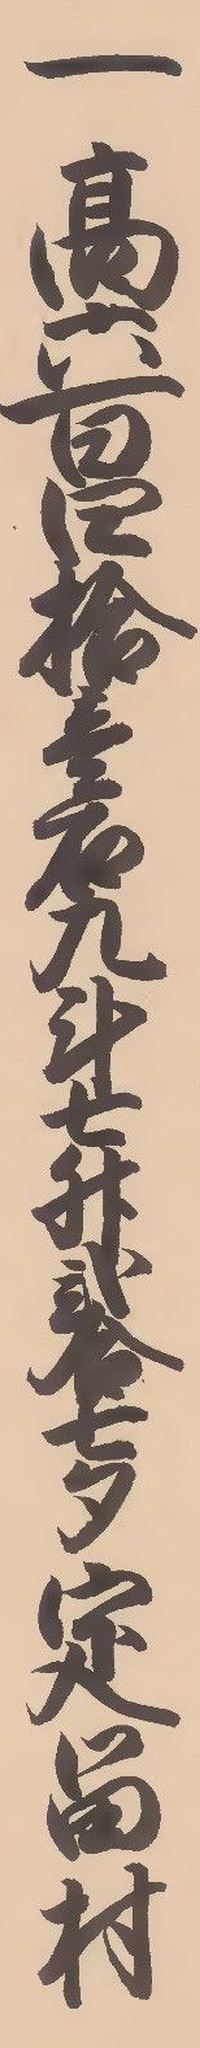一高六百四拾壱石九斗七升弐合七夕定留村
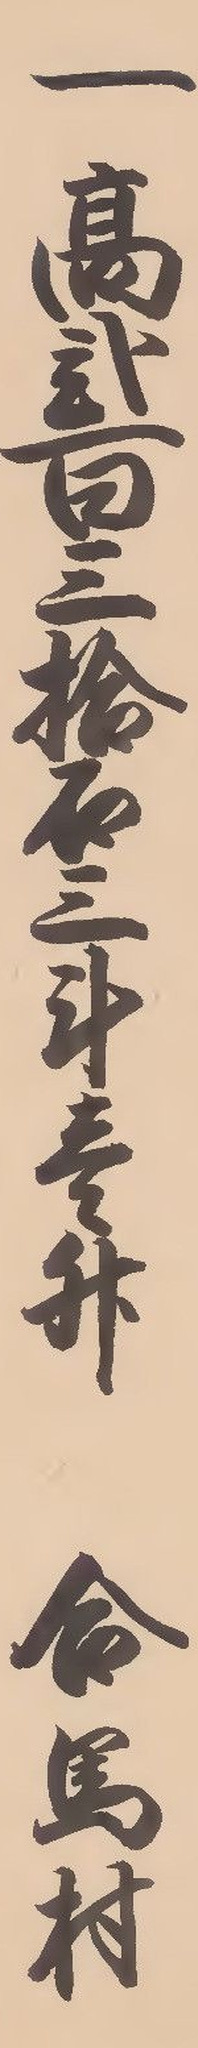一髙弐百三拾石三斗壱升合馬村
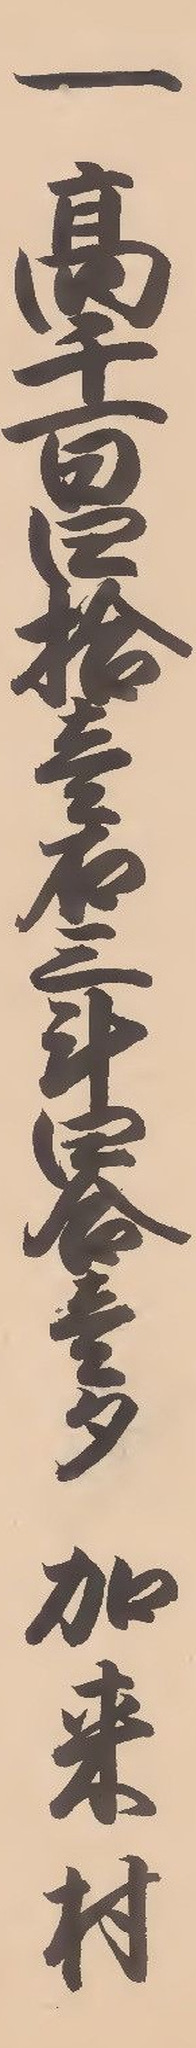一髙千百四拾壱石三斗四合壱夕加来村
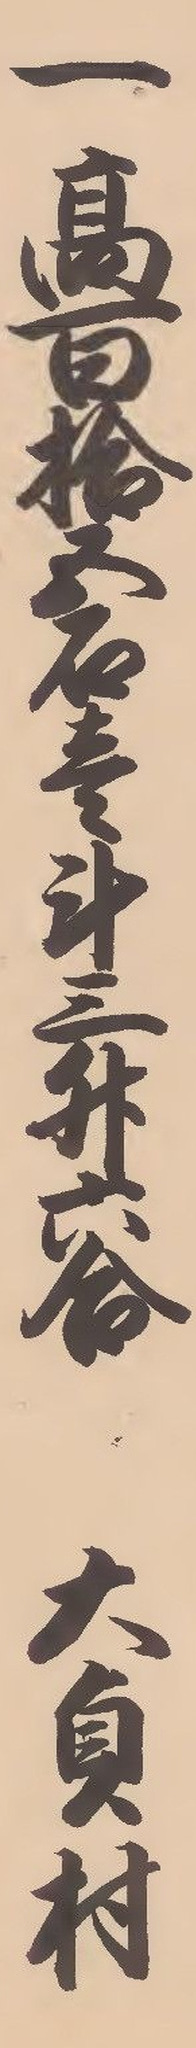一髙百拾五石壱斗三升六合大貞村
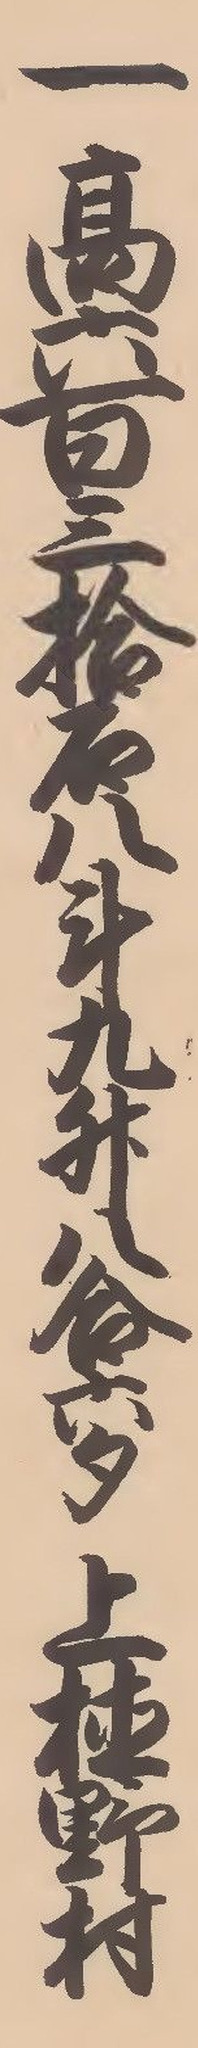一髙六百三拾石八斗九升八合六夕上植野村
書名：豊前国郷帳
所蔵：国立公文書館 National Archives of Japan
